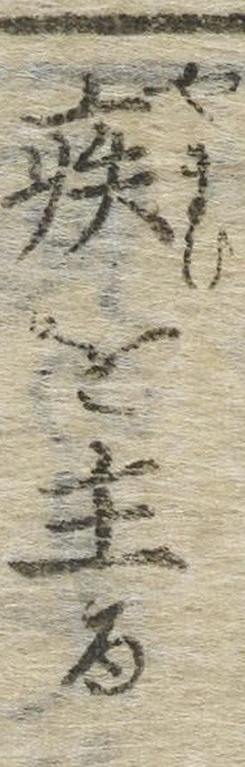疾を主る
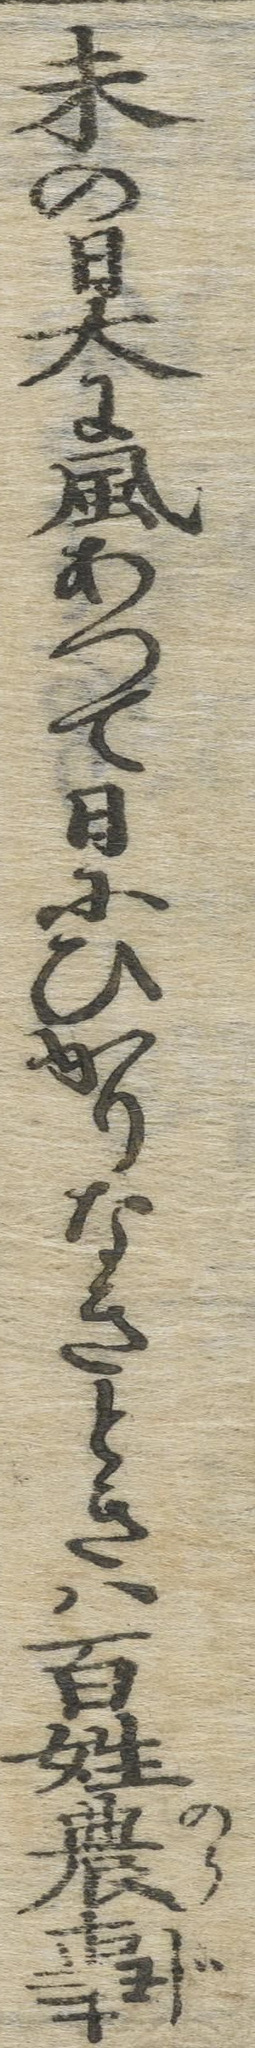未の日大に風あつて日にひかりなきときは百姓農事
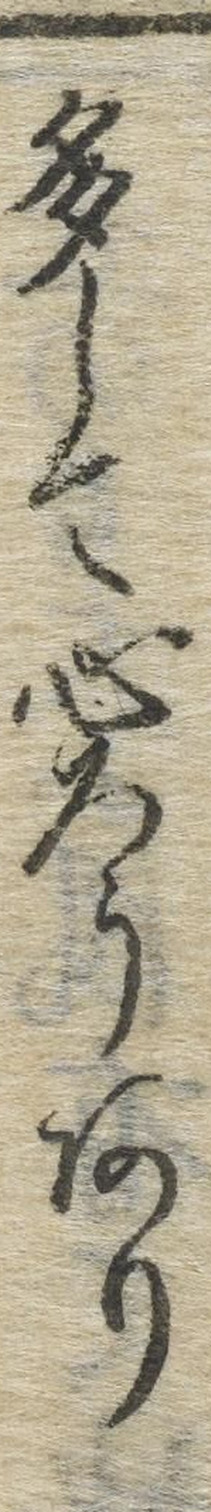多して心ろうあり
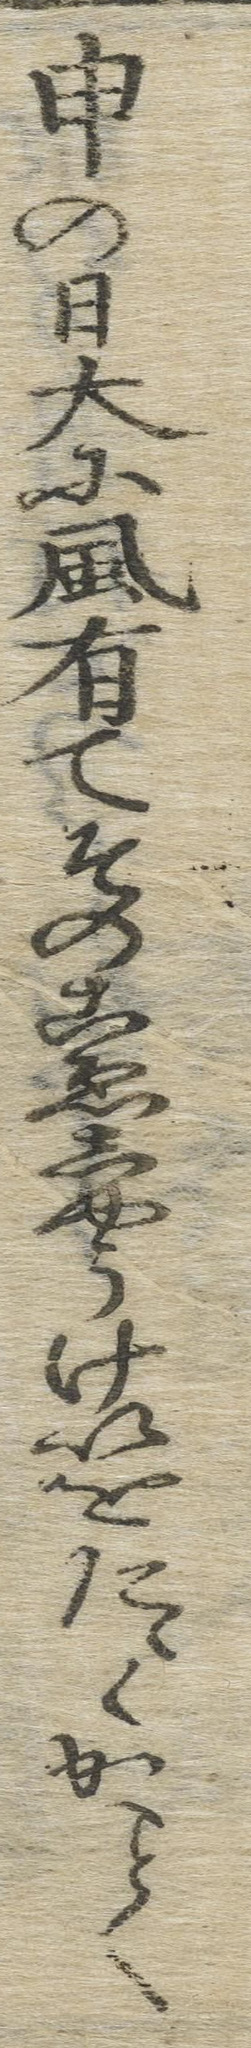申の日大に風有てそのこゑしやうけいをたゝくかことく
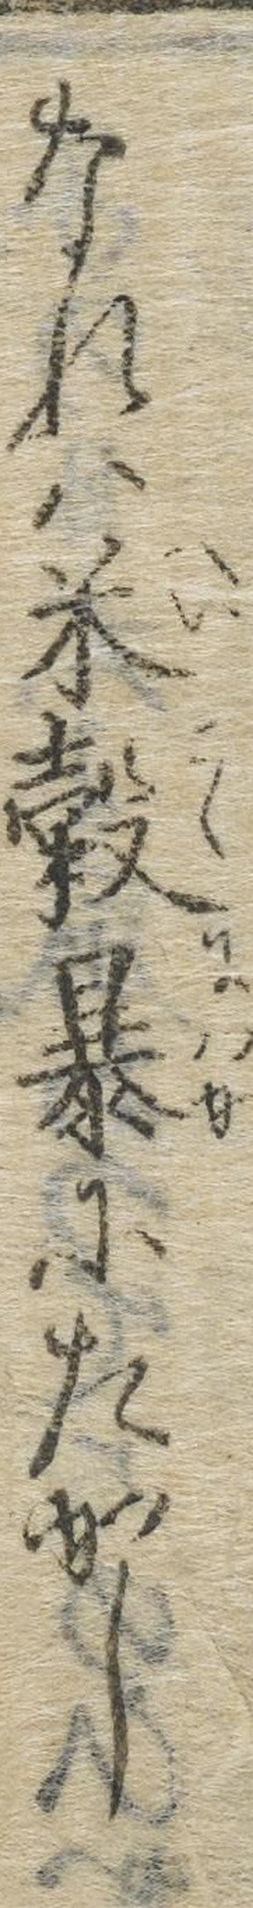なれは米穀暴にたかし
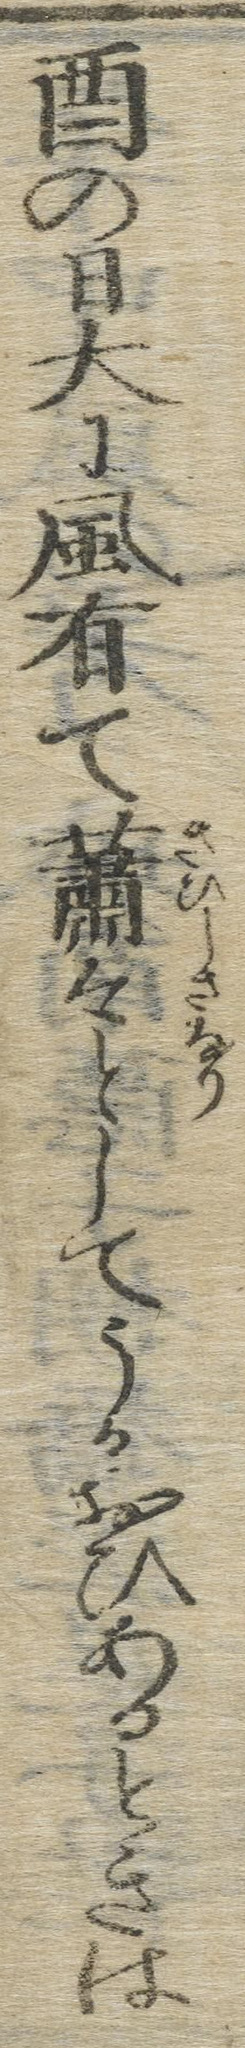酉の日大に風有て蕭々としてうるおひあるときは
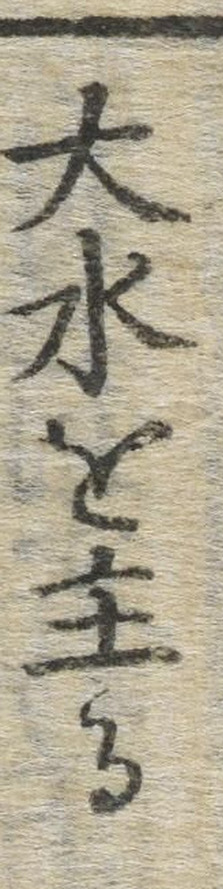大水を主る
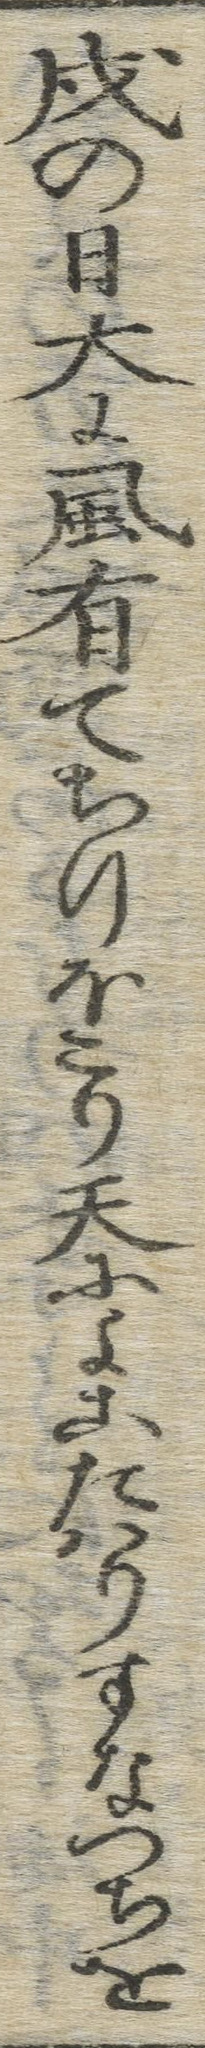戌の日大に風有てちりほこり天によこたはりすなつちを
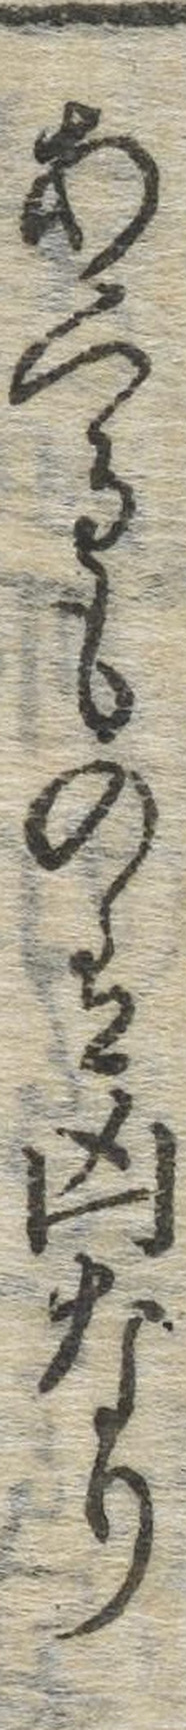あくるものは凶なり
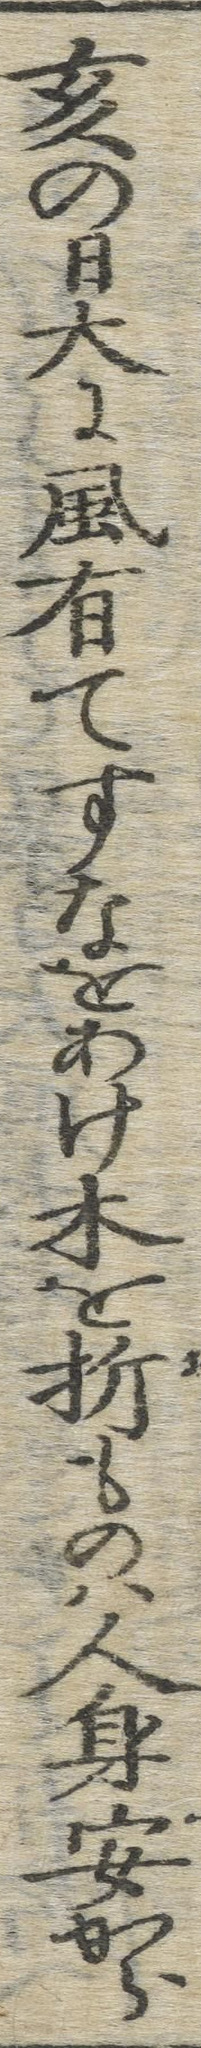亥の日大に風有てすなをあけ木を折ものは人身安から
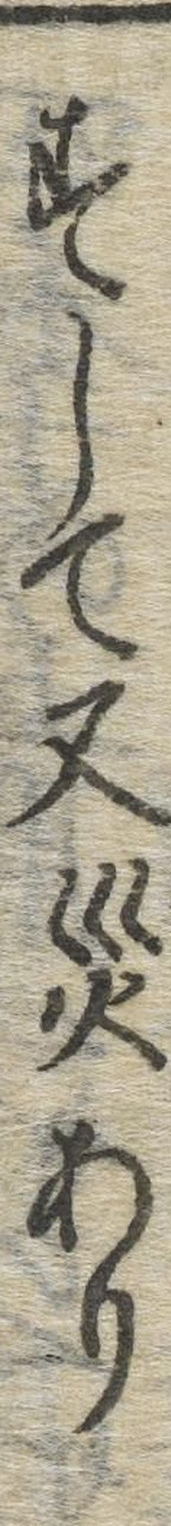すして又災あり
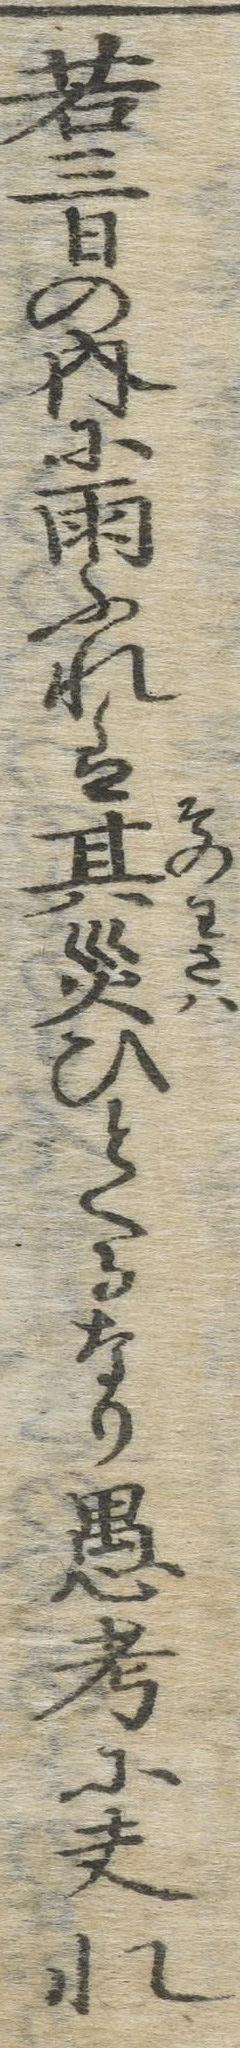若三日の内に雨ふれは其災ひとくるなり愚考に夫れ
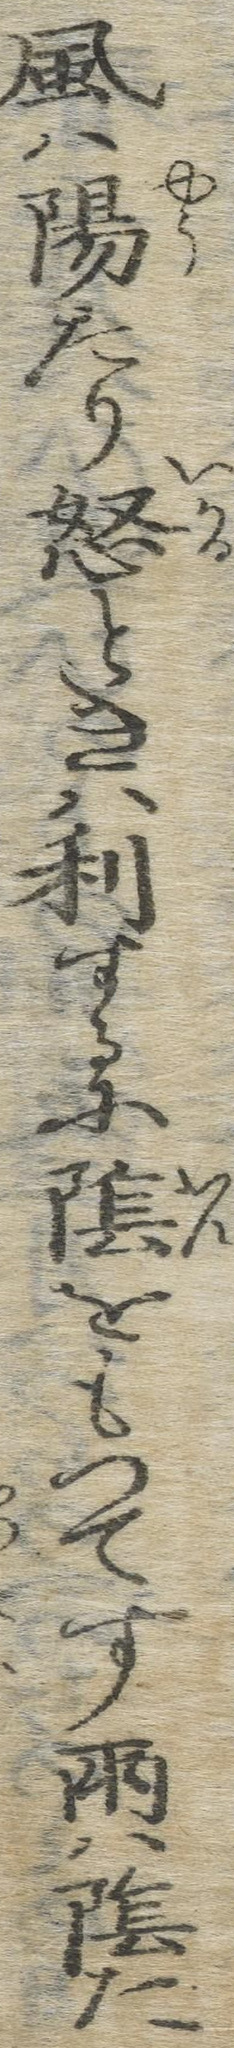風は陽たり怒ときは利するに陰をもつてす雨は陰に
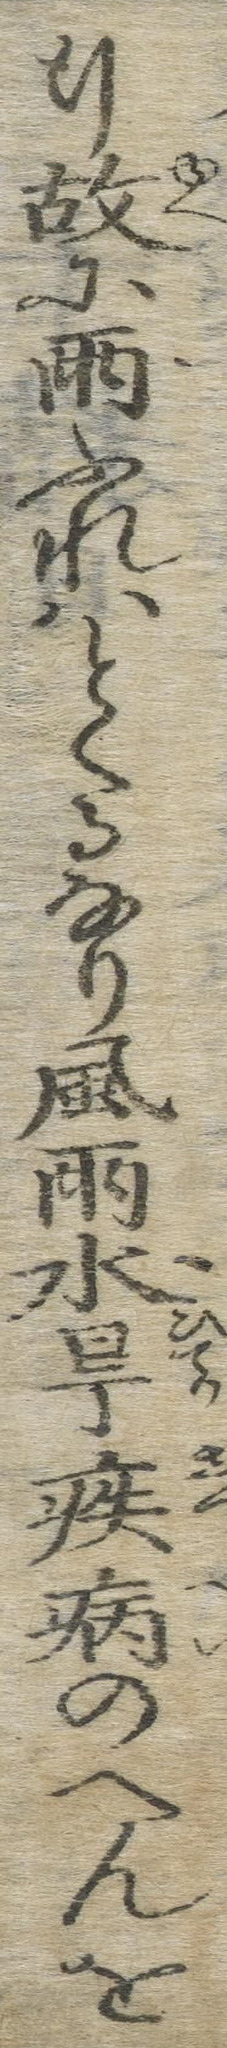行故に雨ふれはとくるなり風雨水旱疾病のへんを
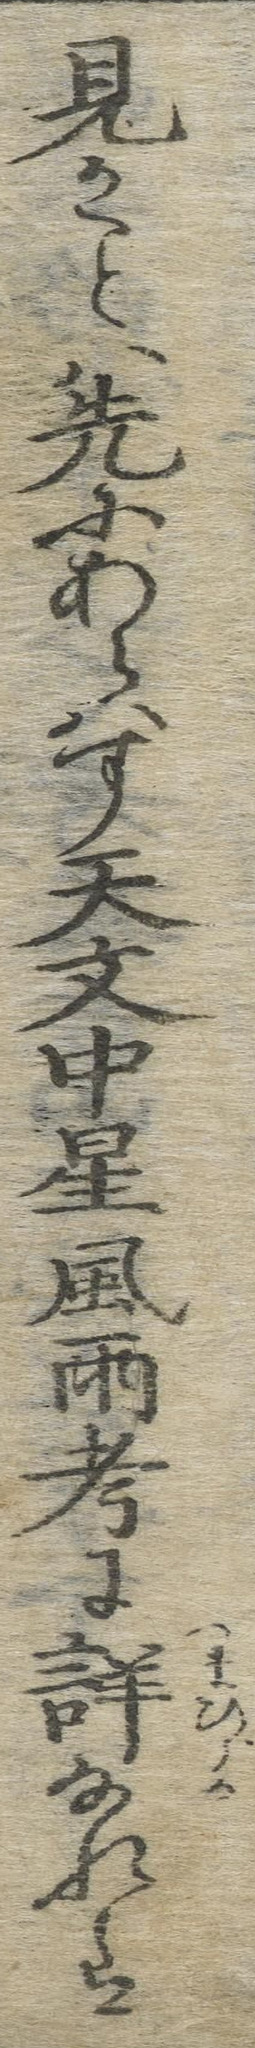見ることは先にあらはす天文中星風雨考に詳なれは

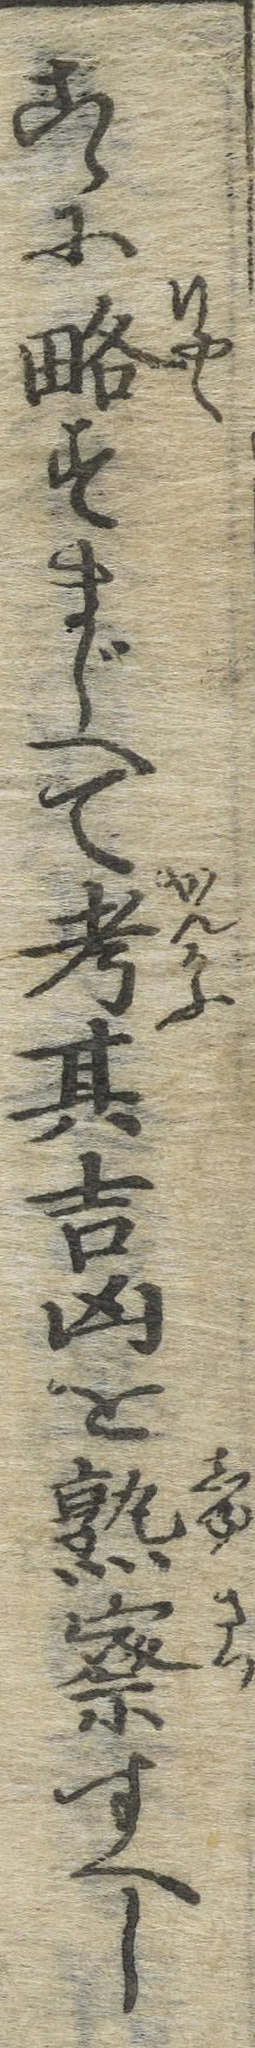こゝに略すまじへて考其吉凶を熟察すへし
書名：[晴雨考]
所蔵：東京大学地震研究所図書室 Earthquake Research Institute Library, The University of Tokyo, JAPAN
